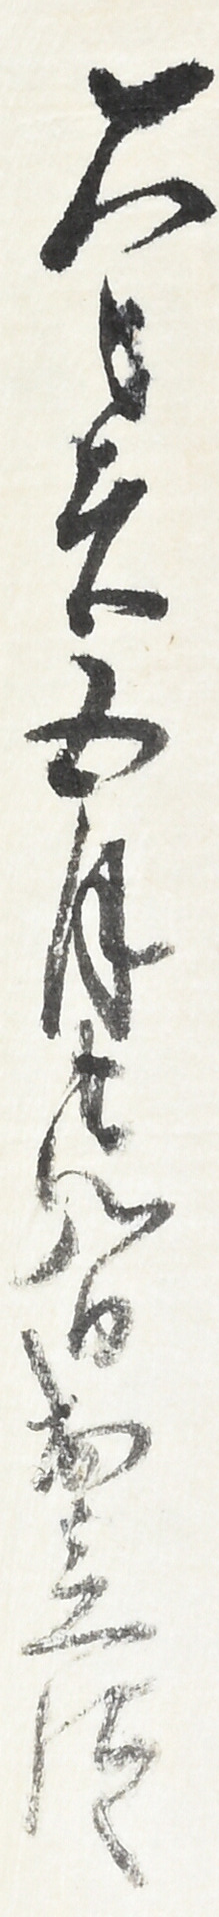右之者五月廿八日出立仕候

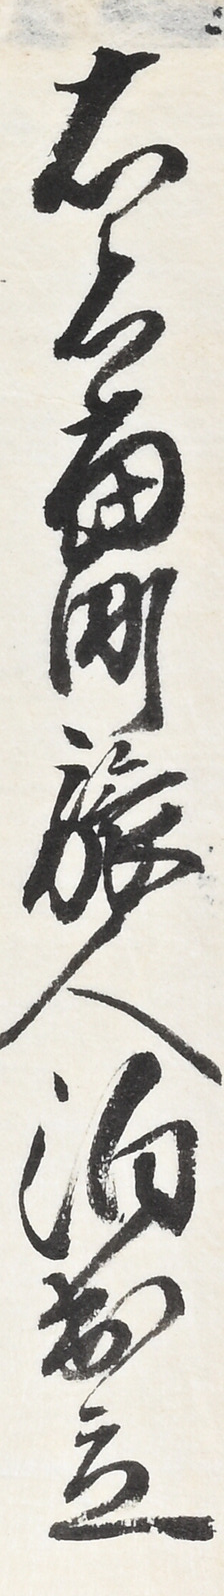右者当町旅人泊出立
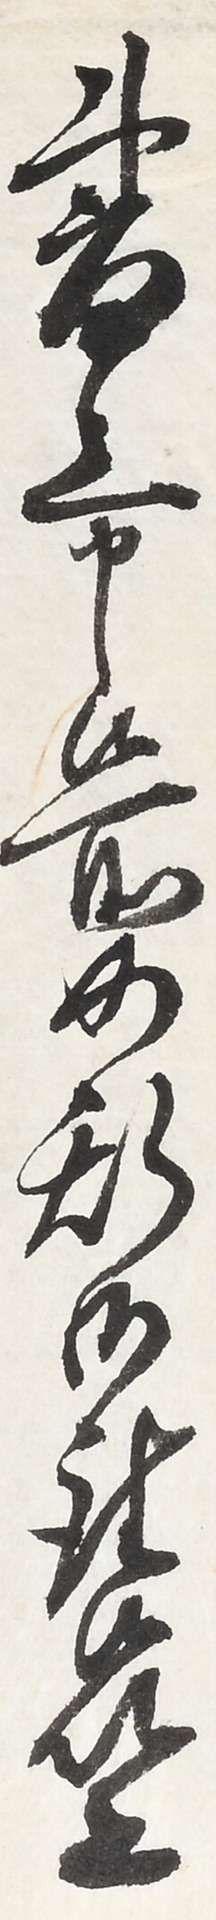書上申候所如斯御座候以上
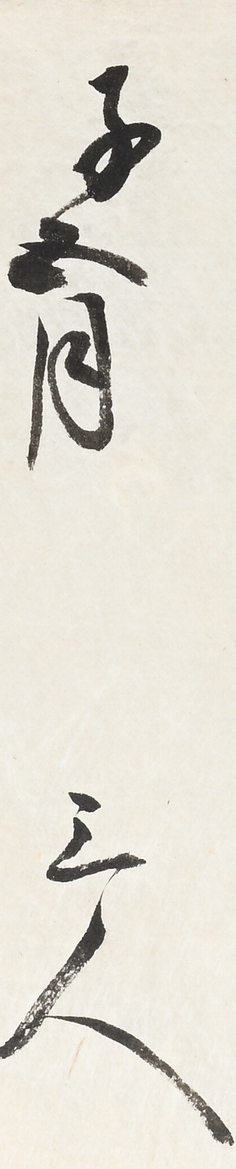子五月三人
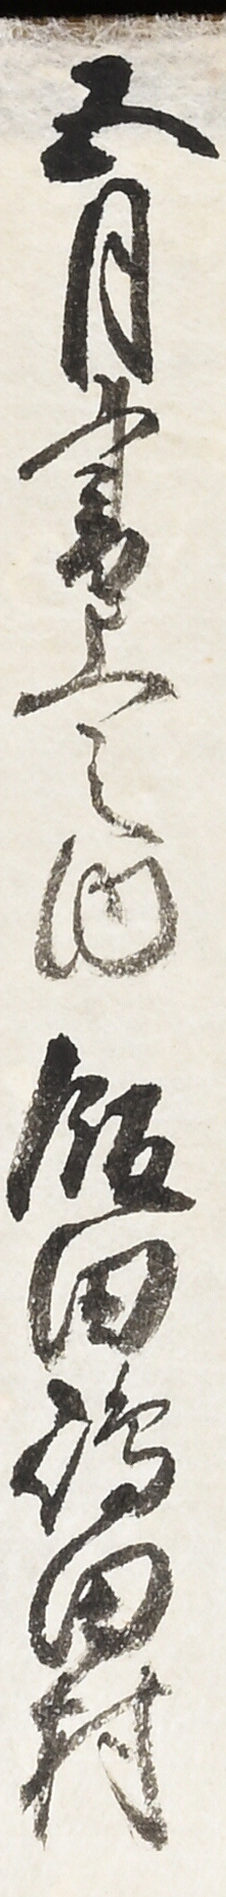五月書上之内飯田伝馬村
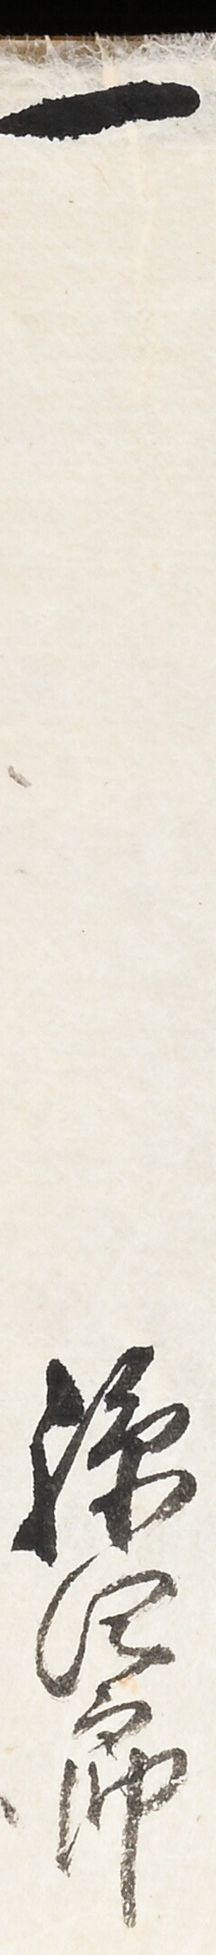一孫四郎
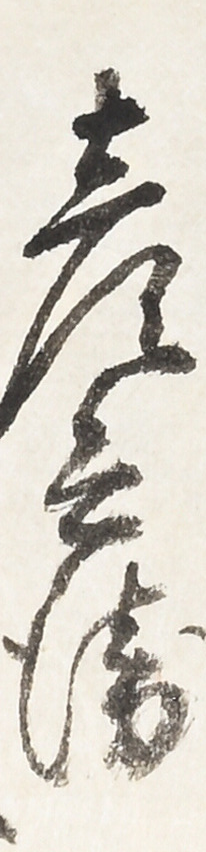彦兵衛
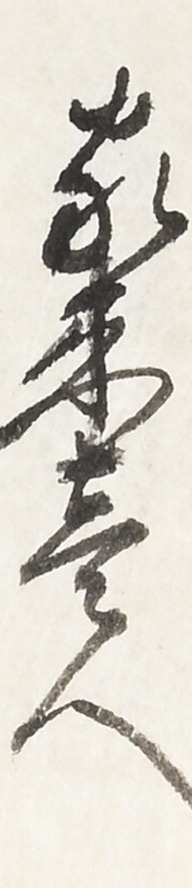家来壱人
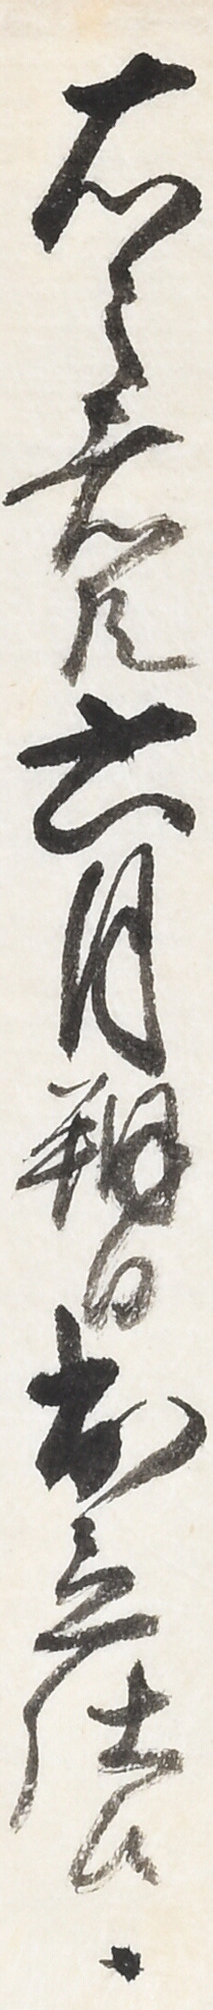右之者共六月朔日出立仕候・
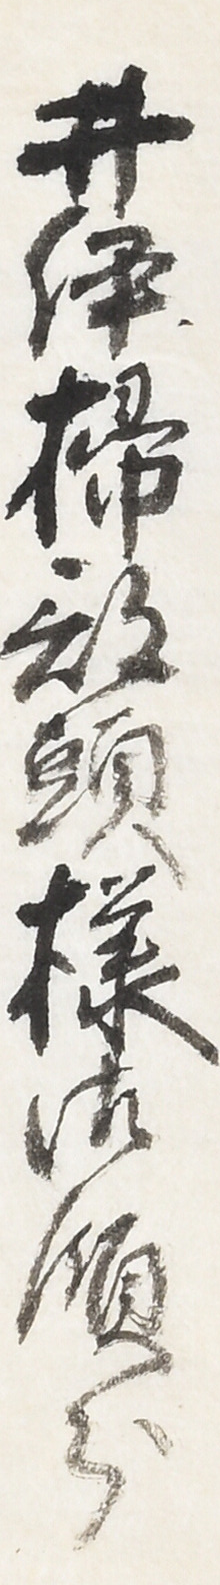井伊掃部頭様御領分
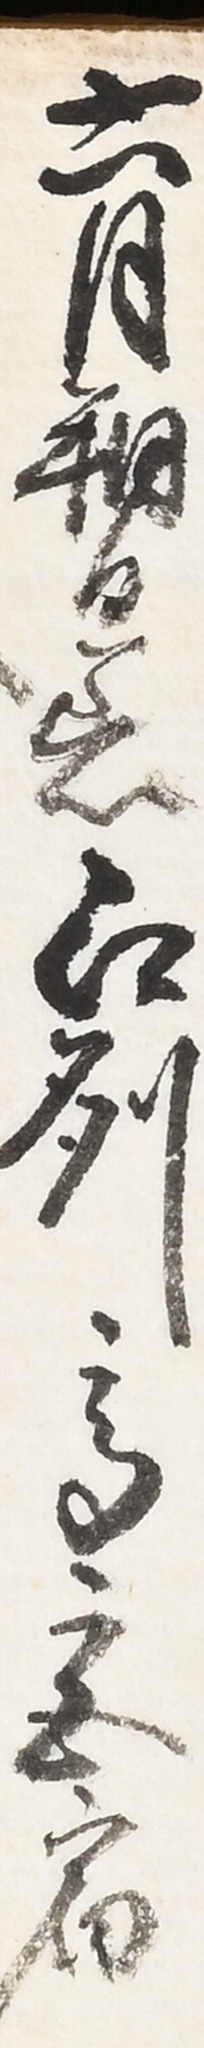六月朔日着江州高宮宿
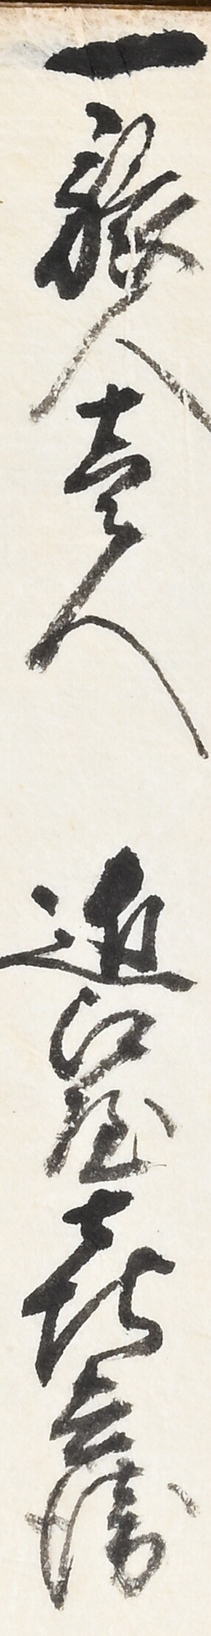一旅人壱人近江屋喜兵衛
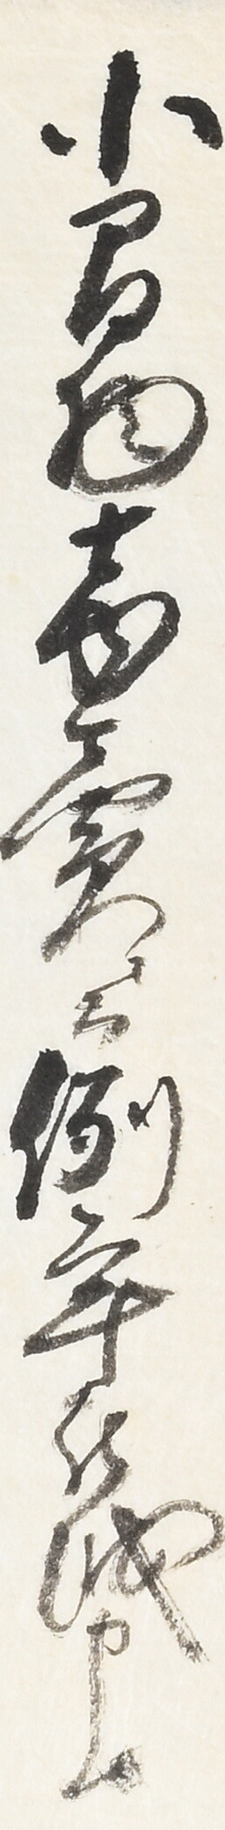小間物商売ニ而例年罷越申候
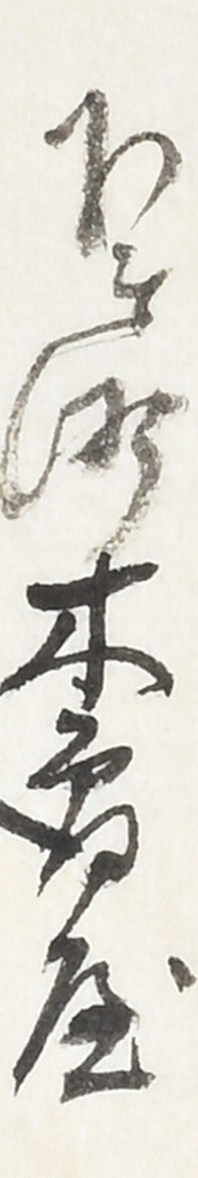下モ町木曽屋
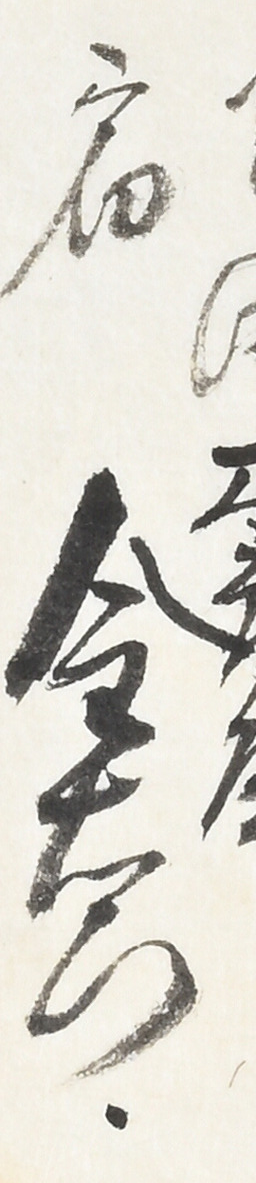宿金右衛門
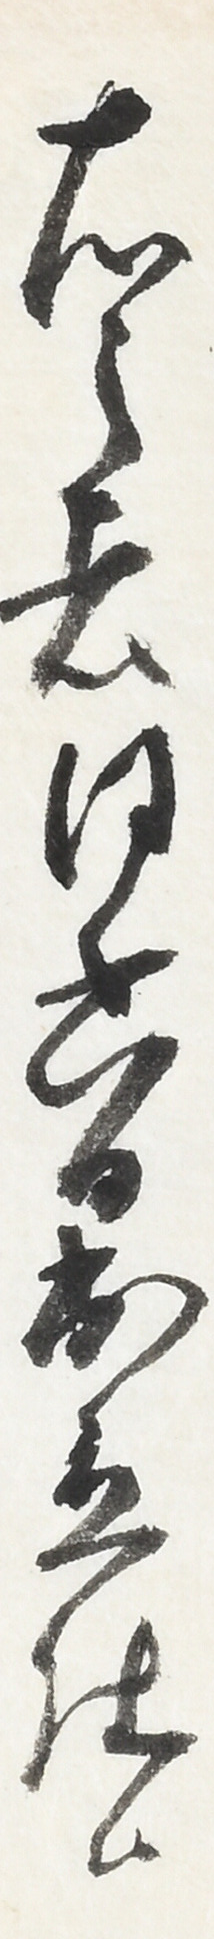右之者同六日出立仕候
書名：旅人泊控帳
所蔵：伊那市立高遠町図書館・合同会社AMANE
